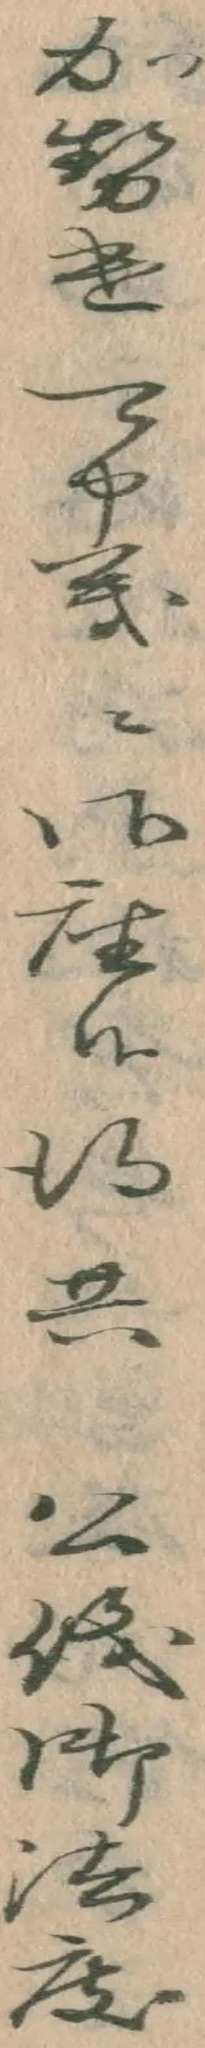加勢遣可申義に御座候得共公儀御法度
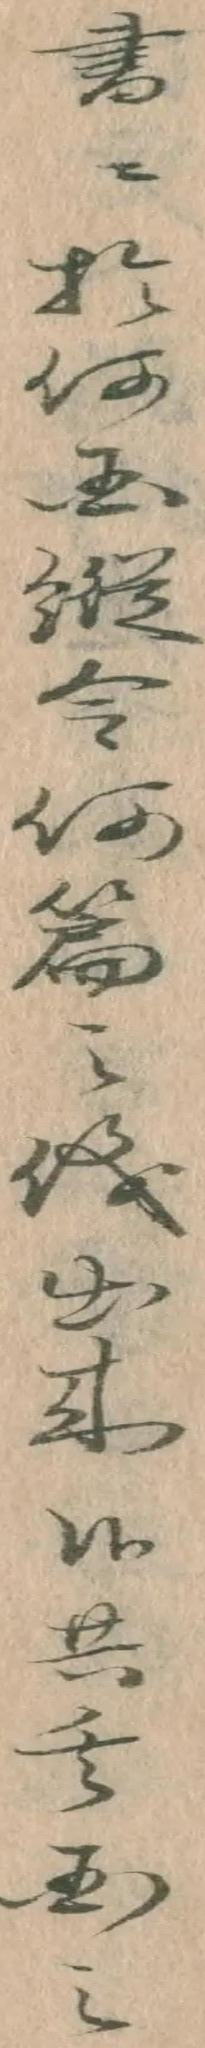書に於何国縦令何篇之儀出来候共其国之
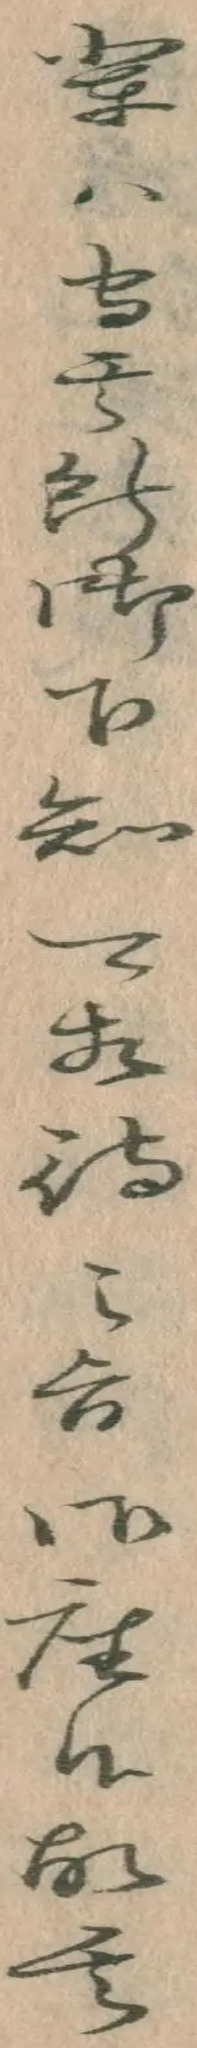輩は守其所御下知可相待之旨御座候故其
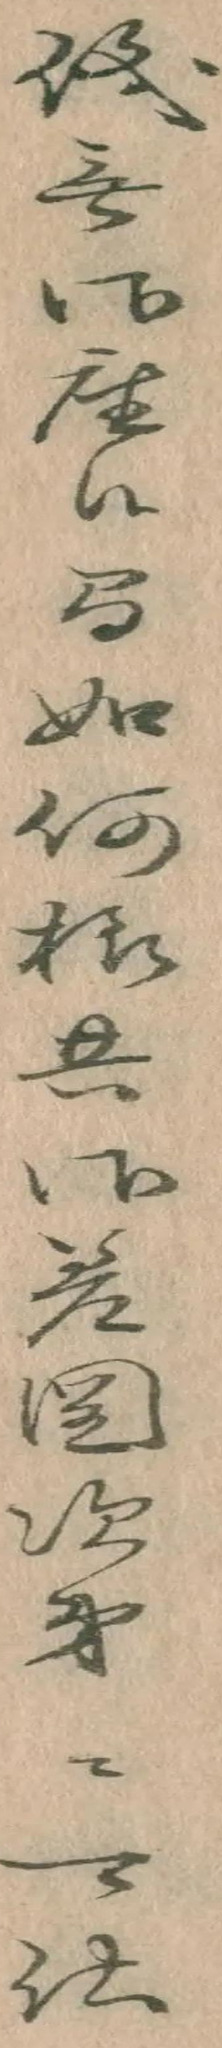儀無御座候間如何様共御差図次第に可仕
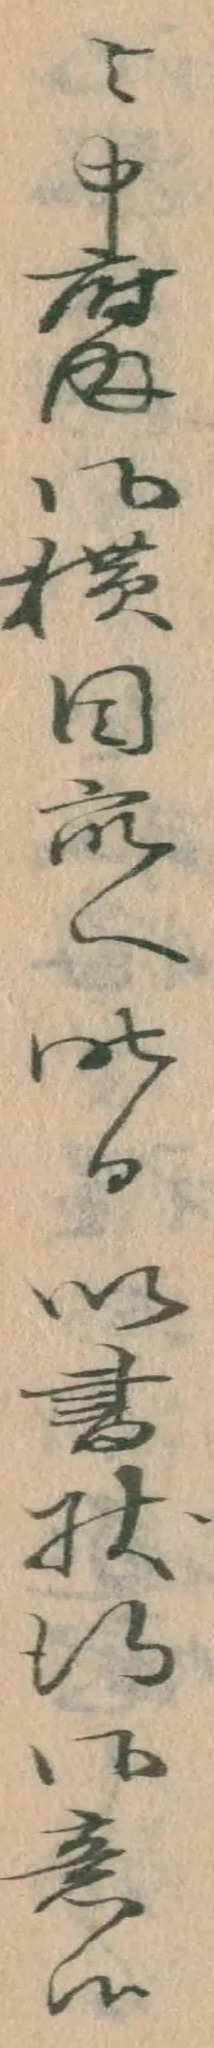与申府内御横目衆へ昨日以書状得御意候
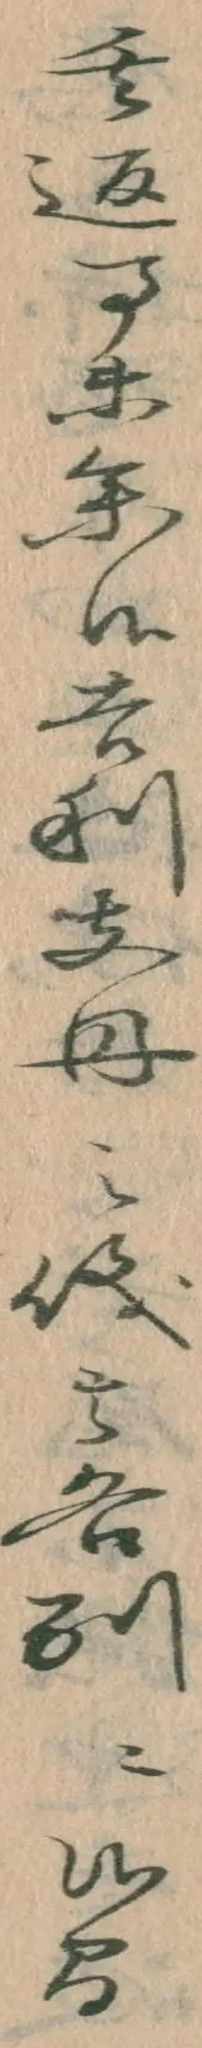其返事未参候吉利支丹之儀者各列に候間
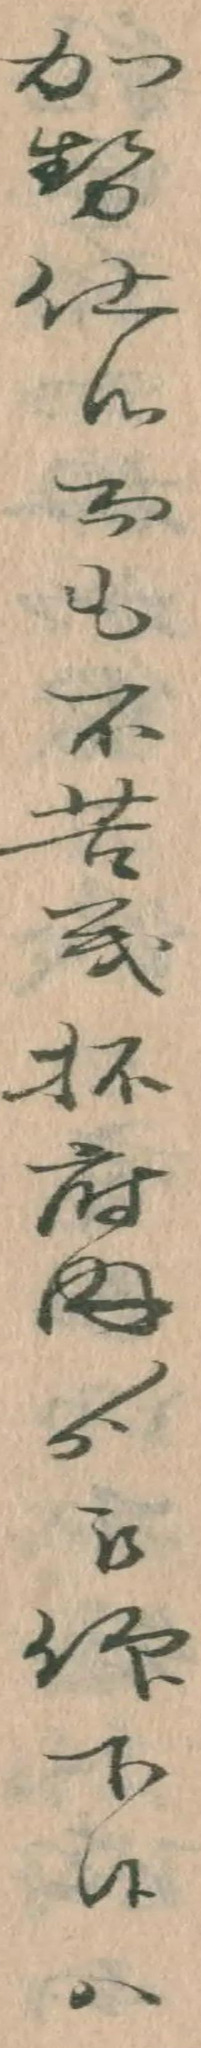加勢仕候而も不苦義抔府内ゟ被仰下候は
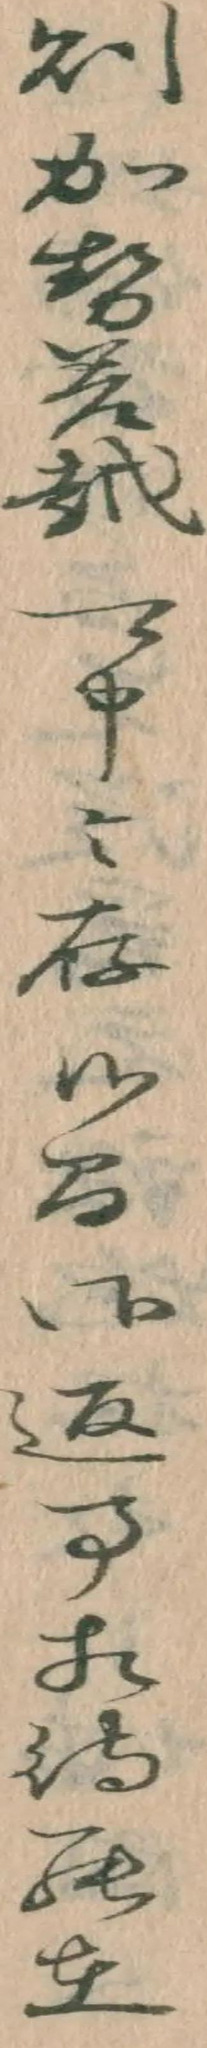則加勢差越可申与存候間御返事相待罷在
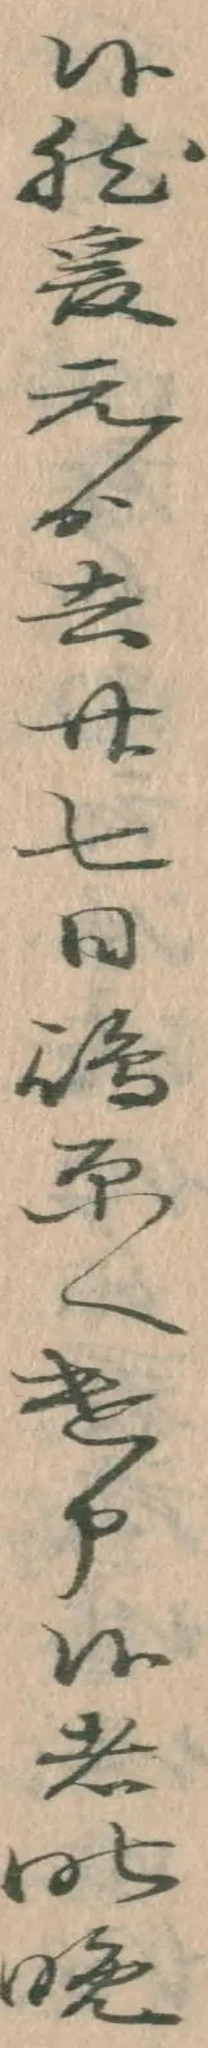候然爰元ゟ去廿七日島原へ遣申候者昨晩
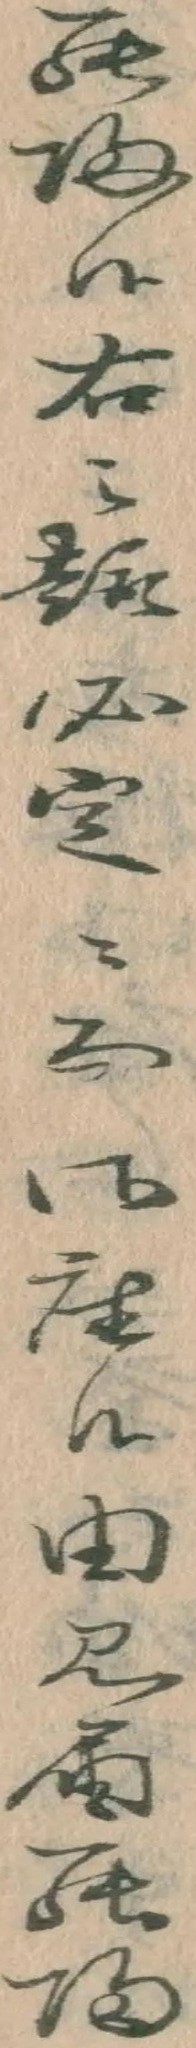罷帰候右之趣必定に而御座候由見届罷帰
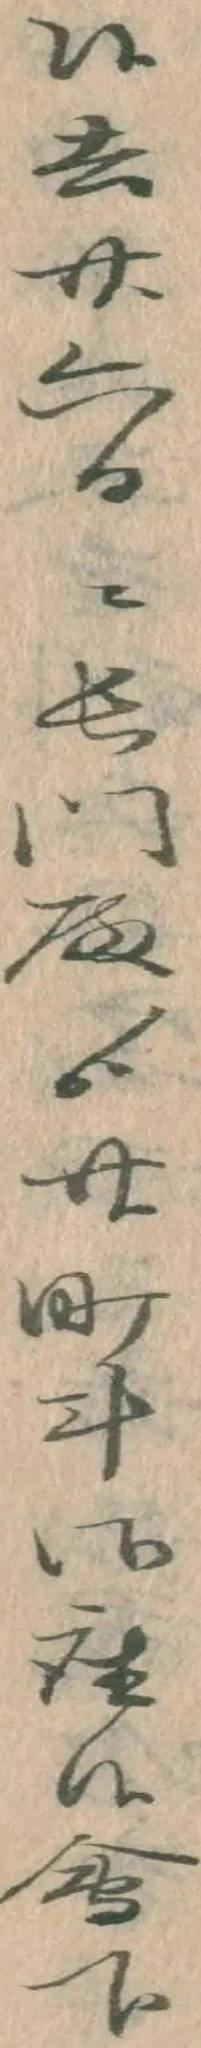候去廿六日に長門殿ゟ廿町斗御座候会下
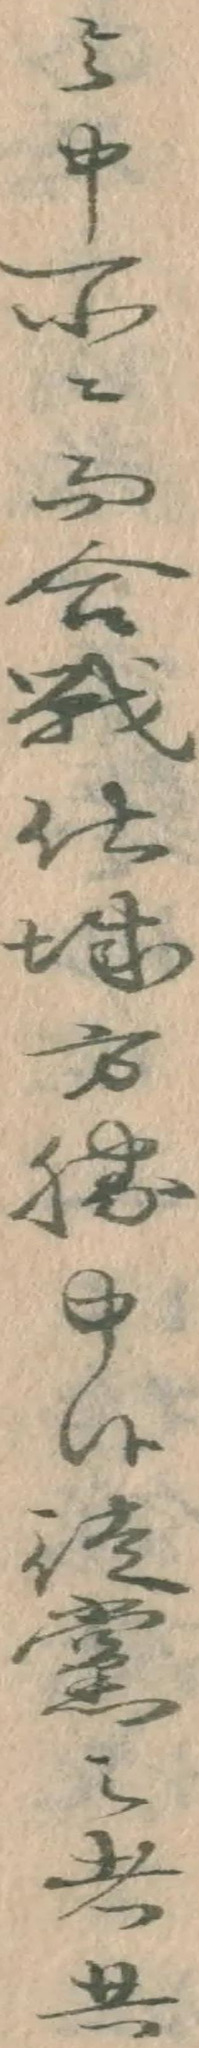与申所に而合戦仕城方勝申候徒党之者共
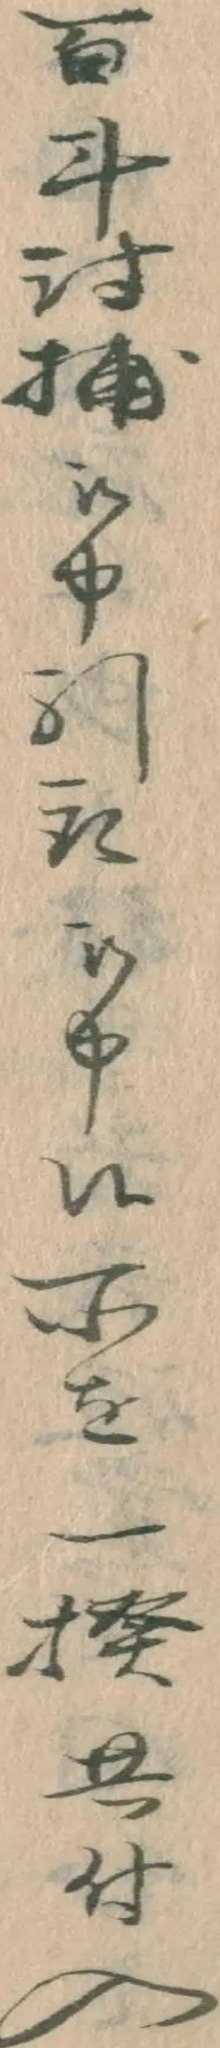百斗討捕被申引取被申候所を一揆共付入
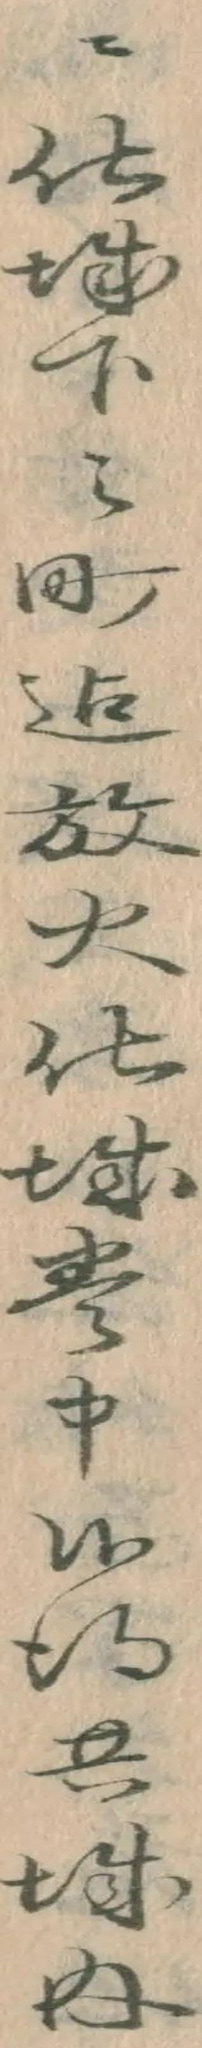に仕城下之町迄放火仕城巻申候得共城内
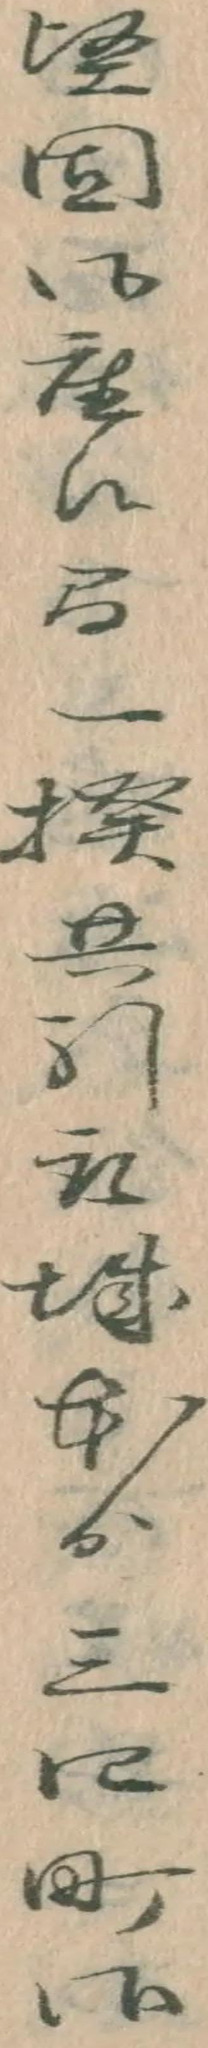堅固御座候間一揆共引取城本ゟ三四町御
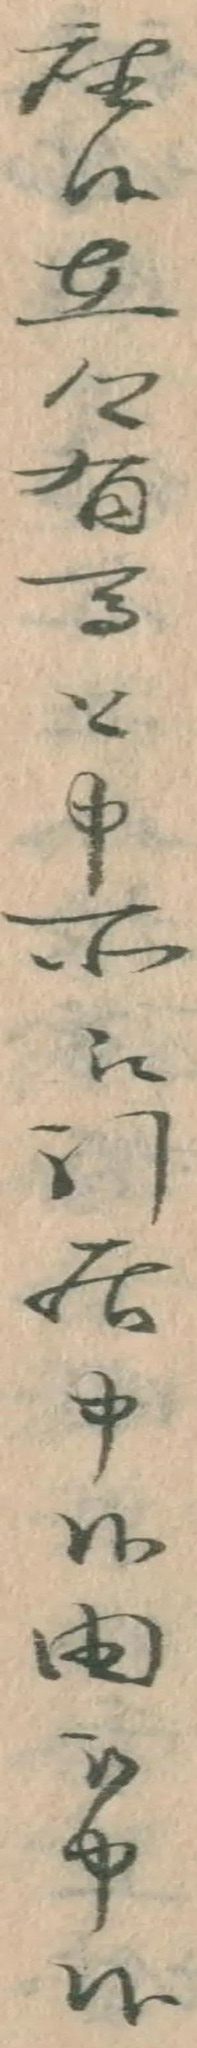座候在郷有馬と申所江引居申候由被申候
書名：切支丹御退治記 49巻. [2]
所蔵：国立国会図書館 National Diet Library, JAPAN
